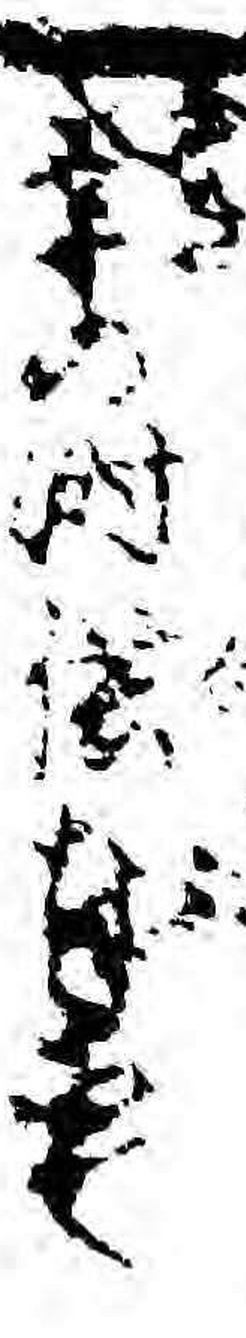幸の時供奉にて
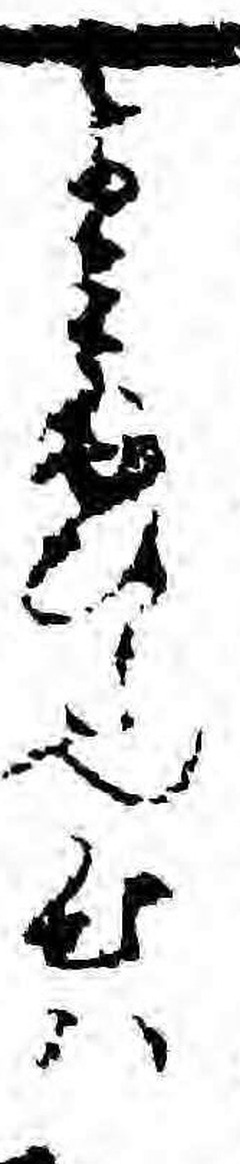よみ給ひし也心は
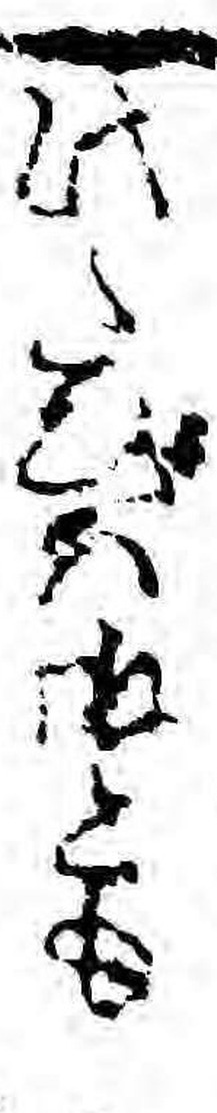此たびは御とも
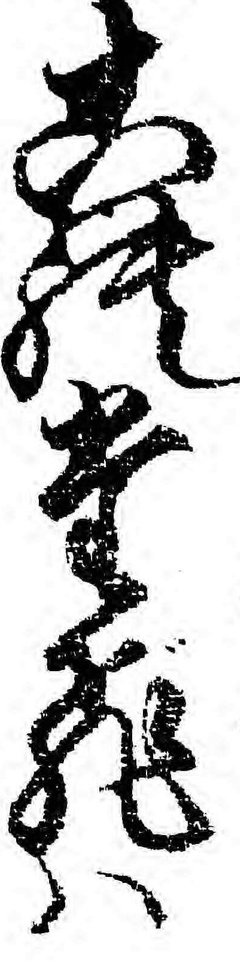このたびは
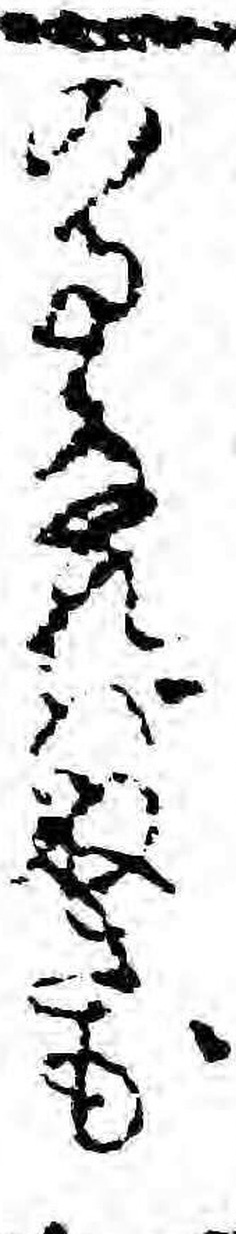の事なればぬさも
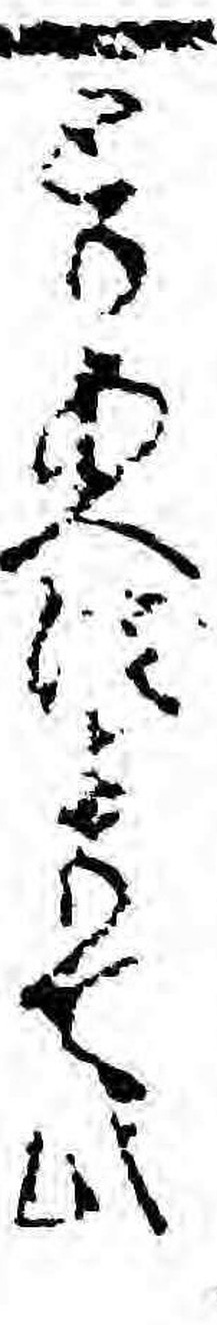とりあへずよりて此
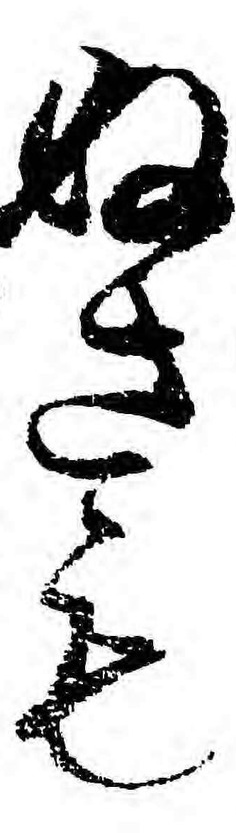ぬさも
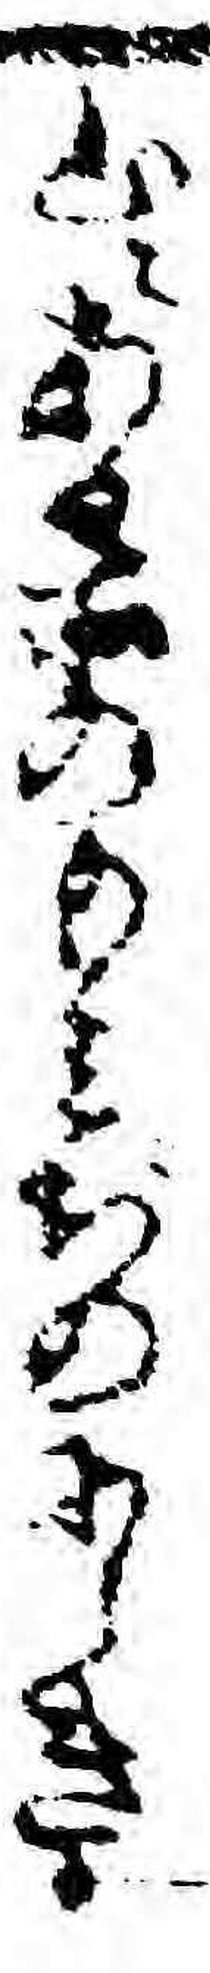山にある所のもみぢのにしき
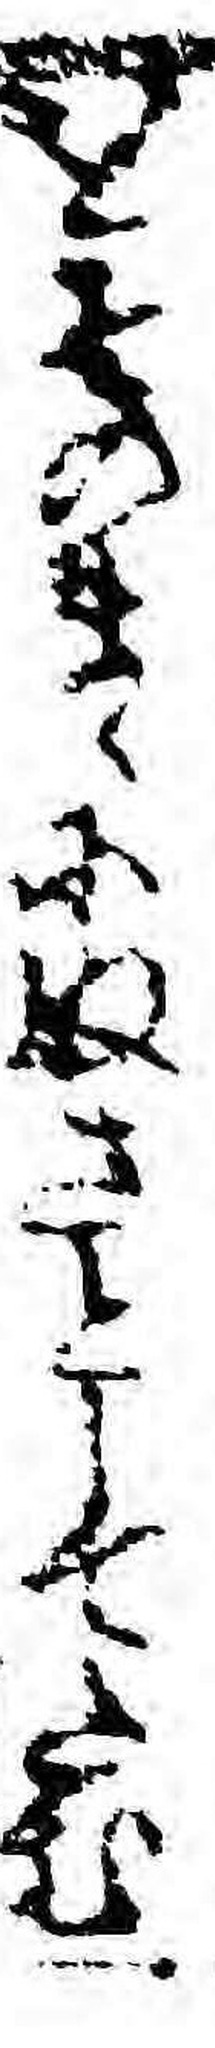をそのまゝにぬさとしてたむ
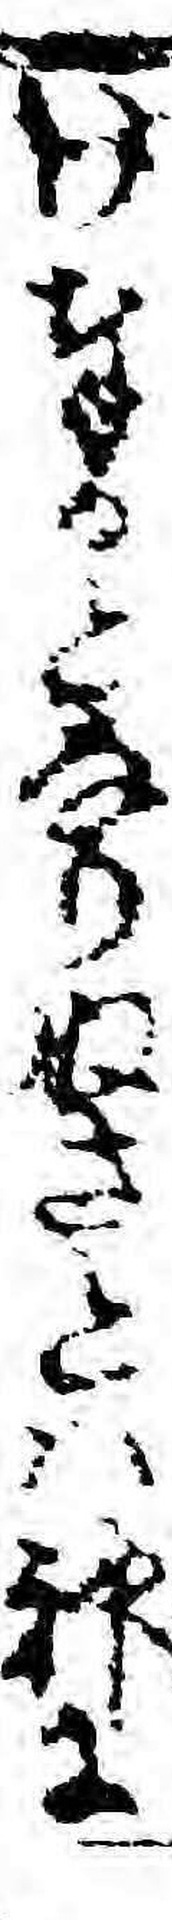け奉るとなりぬさとは神に
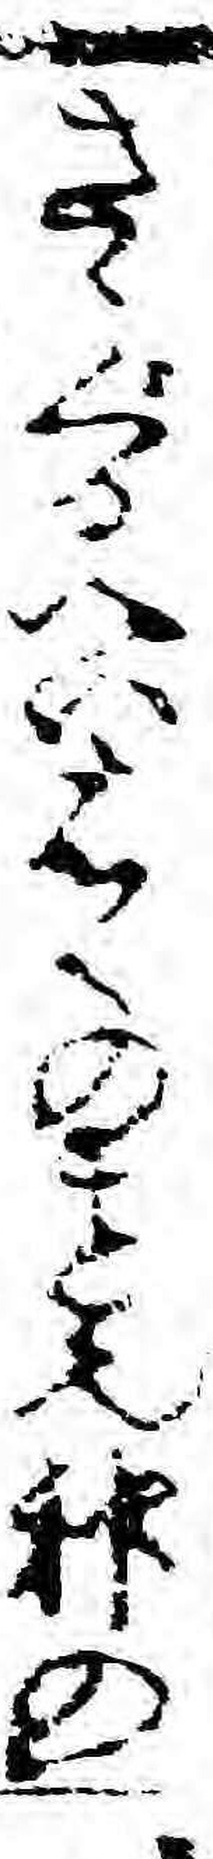さゝぐるへいはくのこと也神の
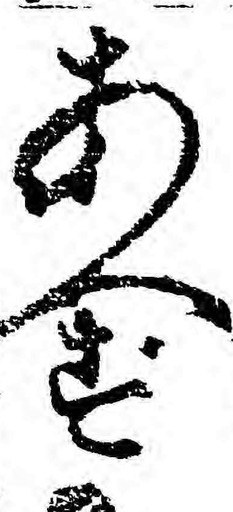あへず
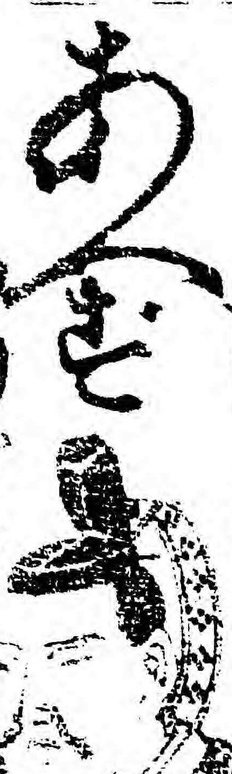あへず
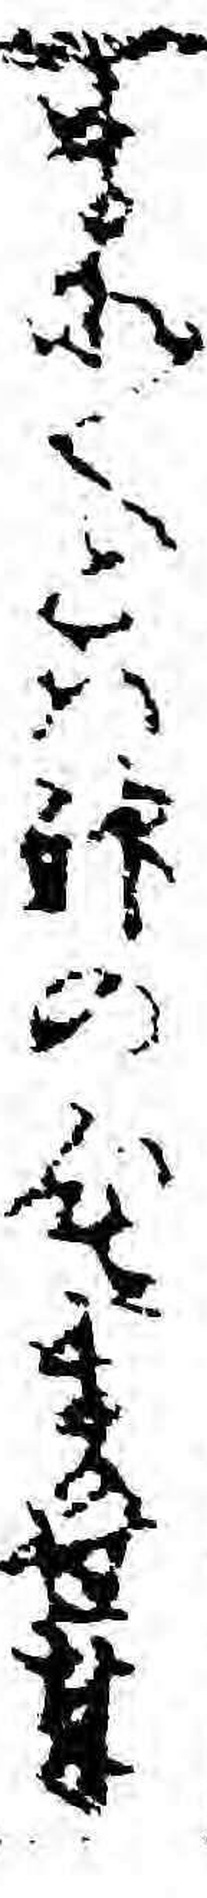まに〳〵とは神の心にまかせ奉
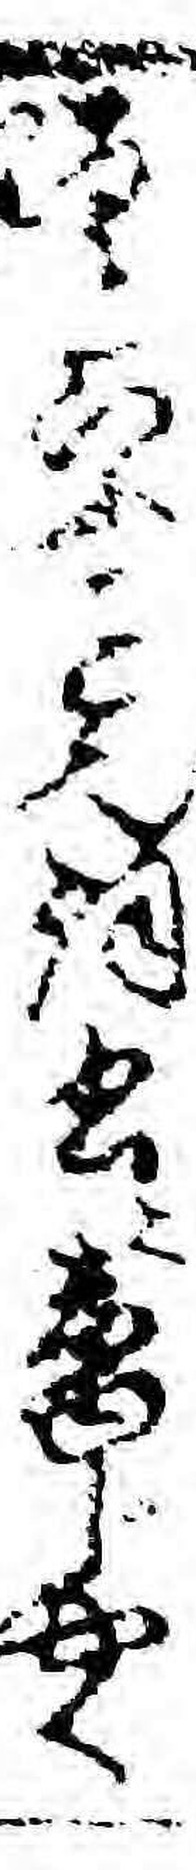るといふこと也詞書にしゆじやく
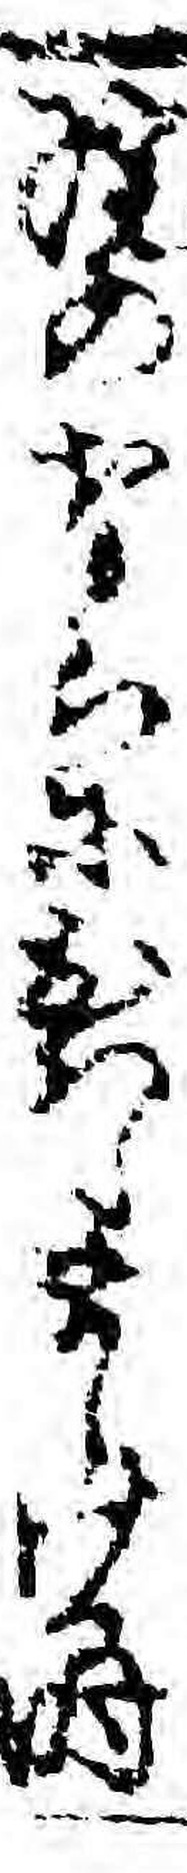院のならにおはしましける時
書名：頭書和歌注譯／壽賀多百人一首小倉錦
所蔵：国文学研究資料館
